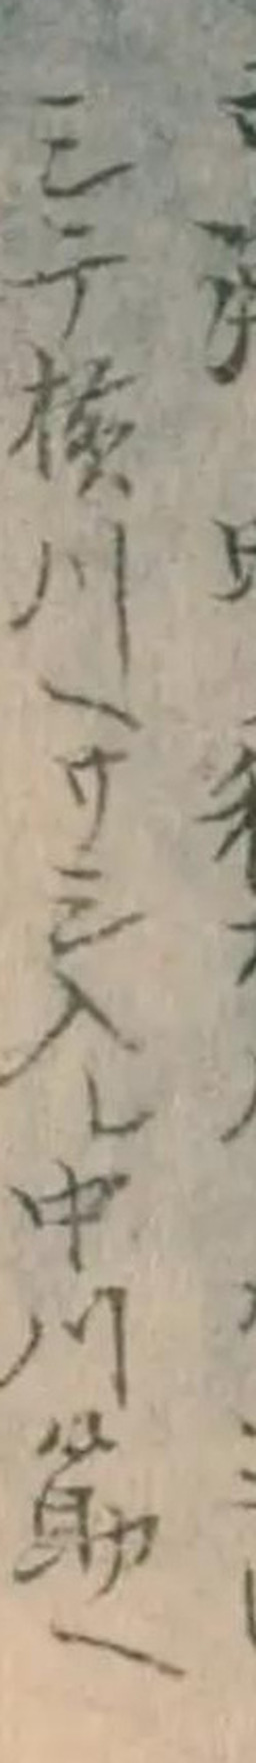シテ横川ヘサシ入レ中川筋へ
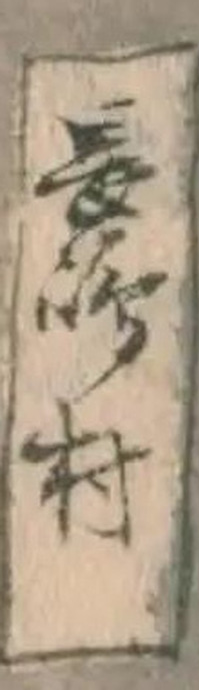長島村
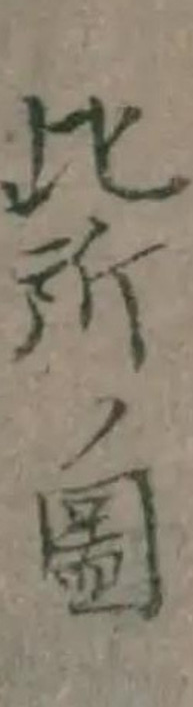此所ノ図
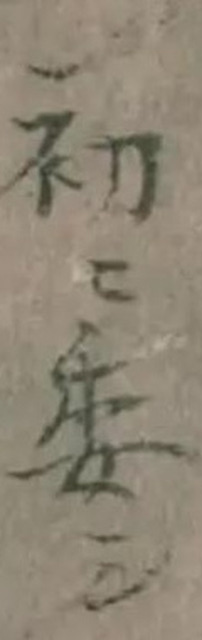初ニ委シ
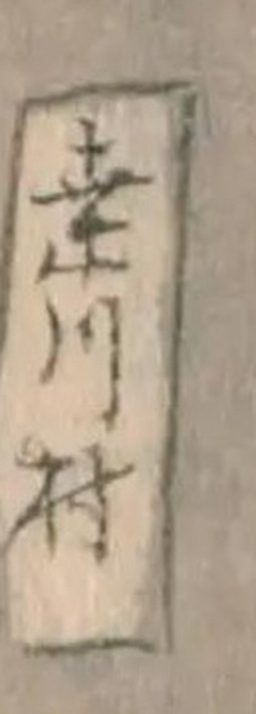桑川村
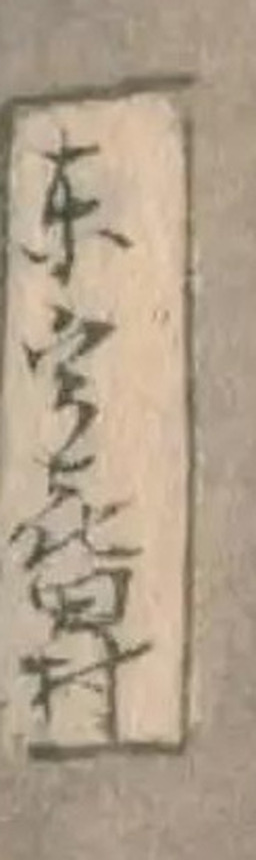東宇喜田村
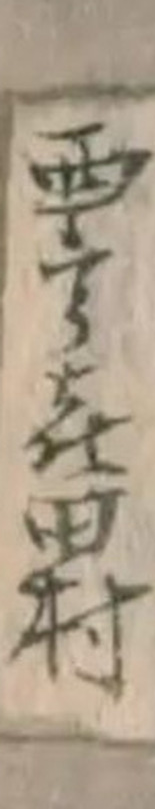西宇喜田村
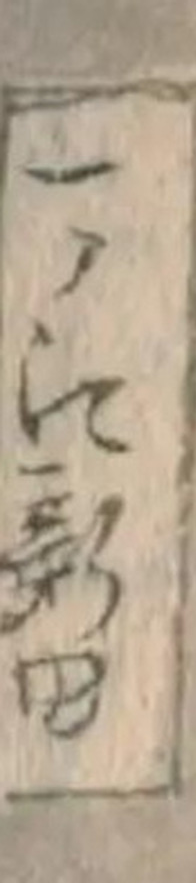一ノ江新田
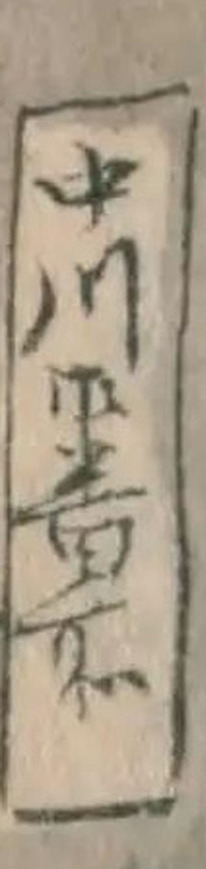中川御番所

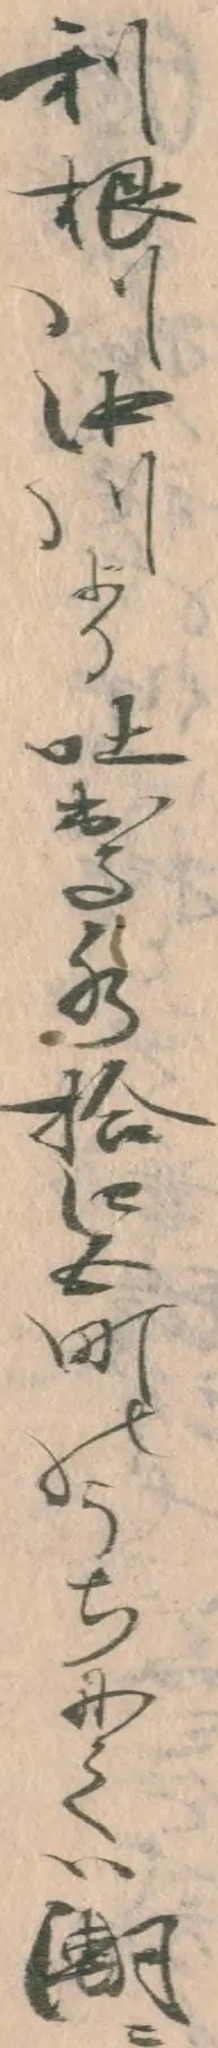利根川中川より吐出る水拾四五町のうちにては潮に
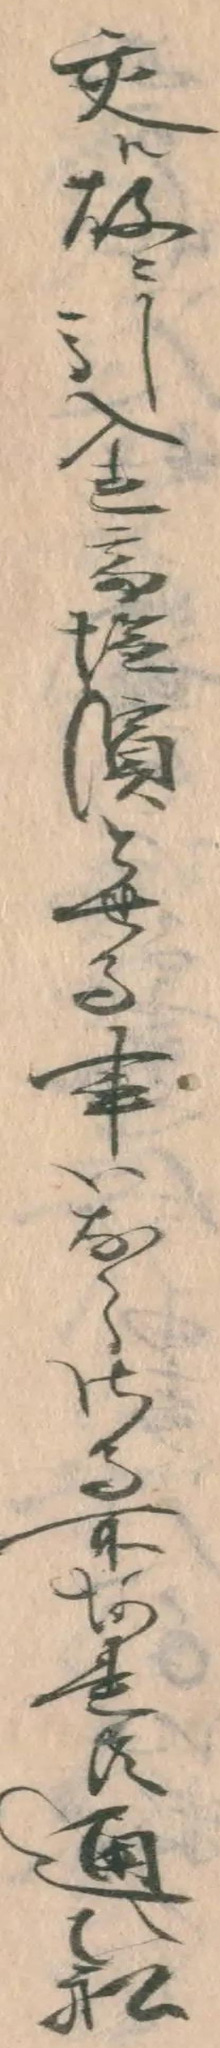交る故に引入れて塩浜とせる事はならさる所なれ共通ひ船
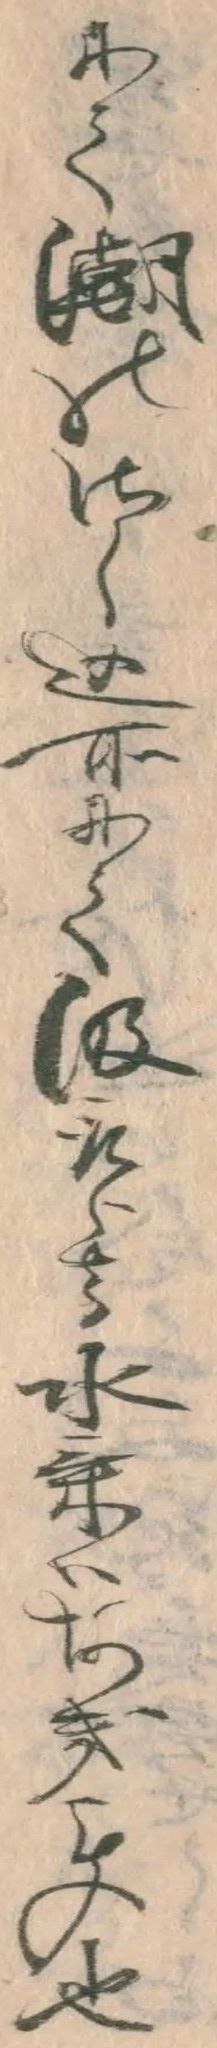にて潮のさし込所にて汲取らは水気はなきもの也
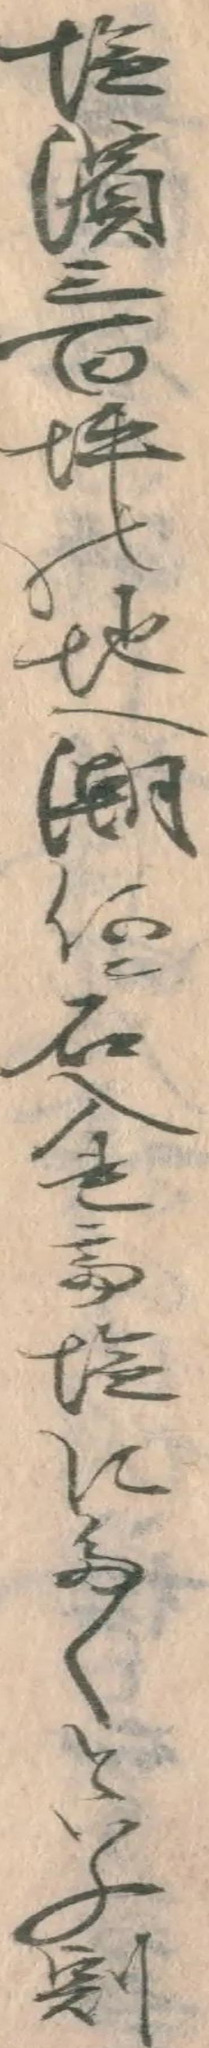塩浜三百坪の地へ潮何石入れて塩にたくといふ割
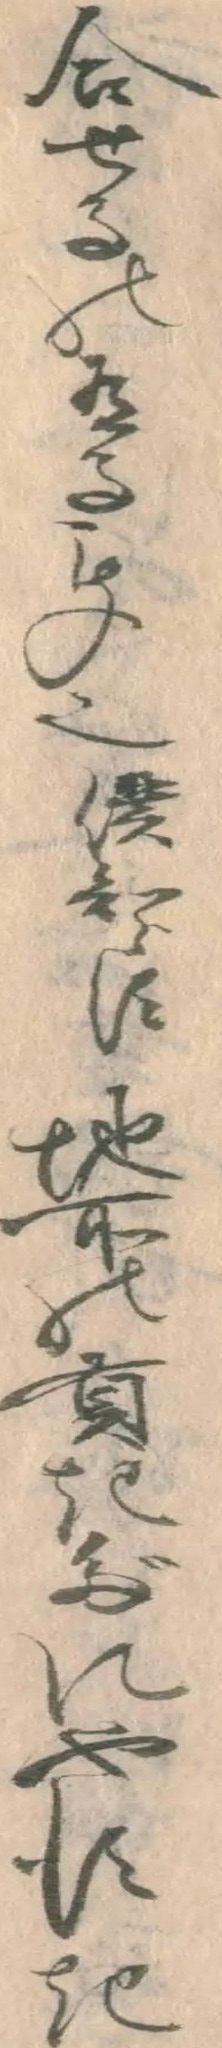合せ事の有るもの也僕知らす地所の貢きだにやすき
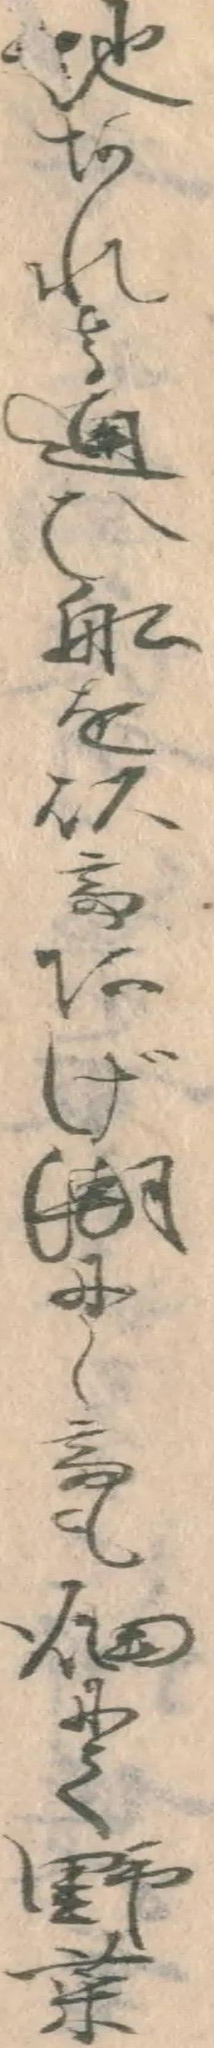地なれは通ひ船を以てあげ湖にしても畑にて野菜
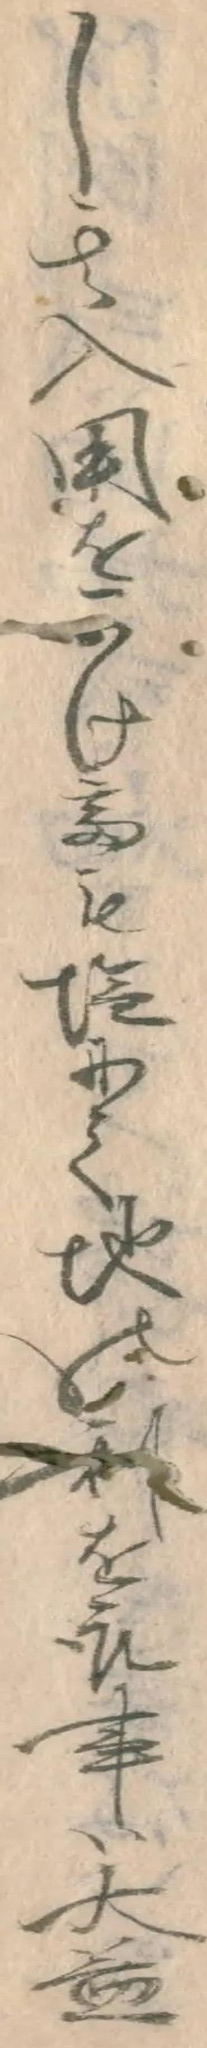し其入用をかけても塩にて地の利を取事は大益
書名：四神地名録 6巻. [4]葛飾郡
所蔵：国立国会図書館 National Diet Library, JAPAN
